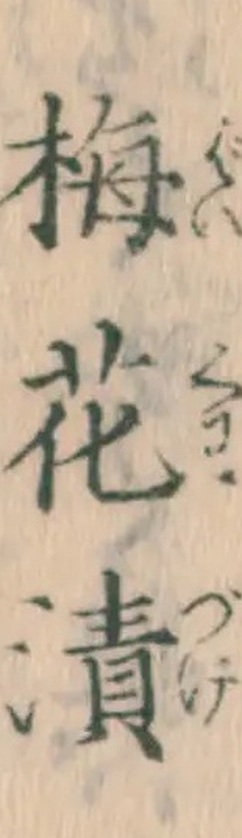梅花漬
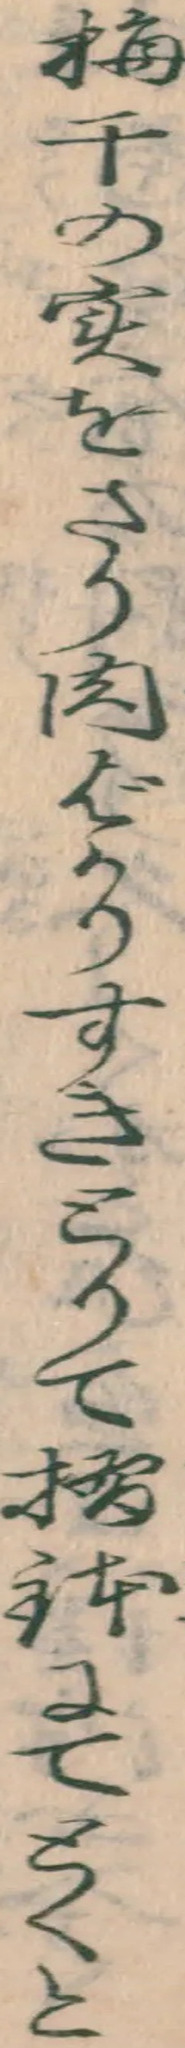梅干の実をさり肉ばかりすきとりて摺鉢にてとくと
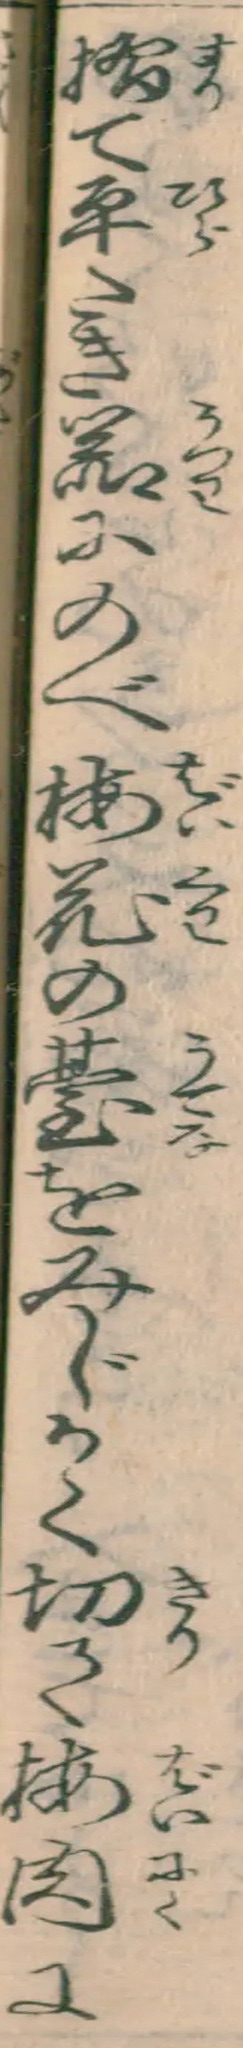摺て平たき器にのべ梅花の台をみじかく切て梅肉に
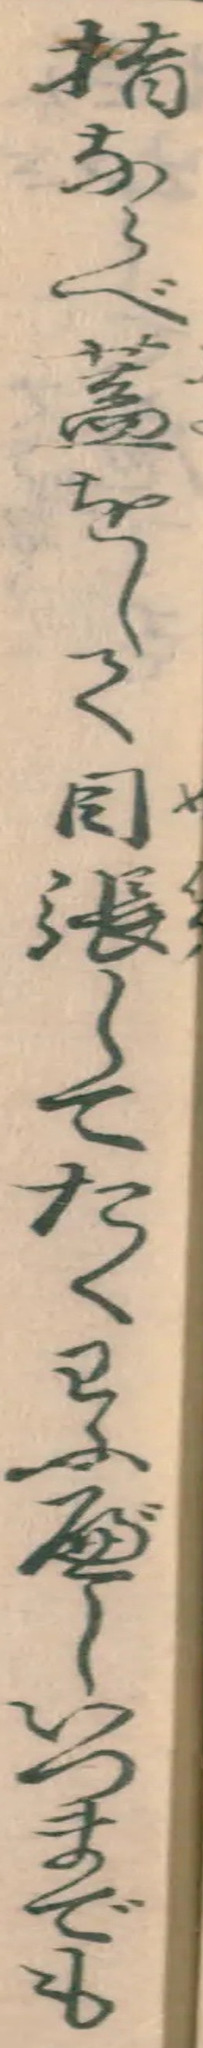指ならべ蓋をして目張してたくわふべしいつまでも
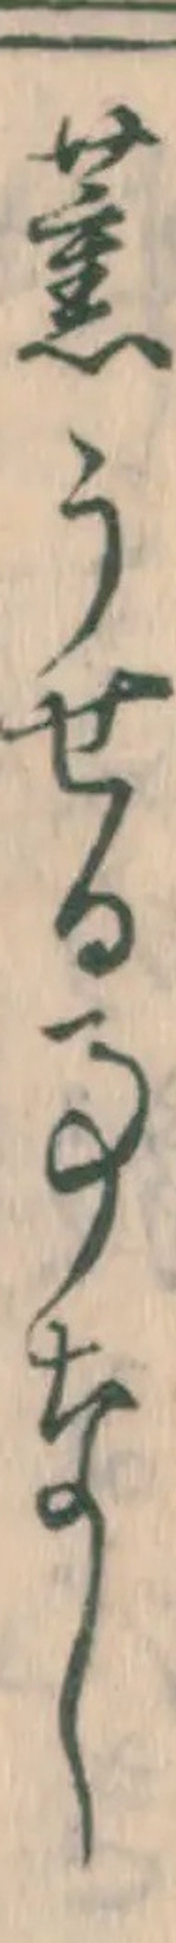薫うせる事なし
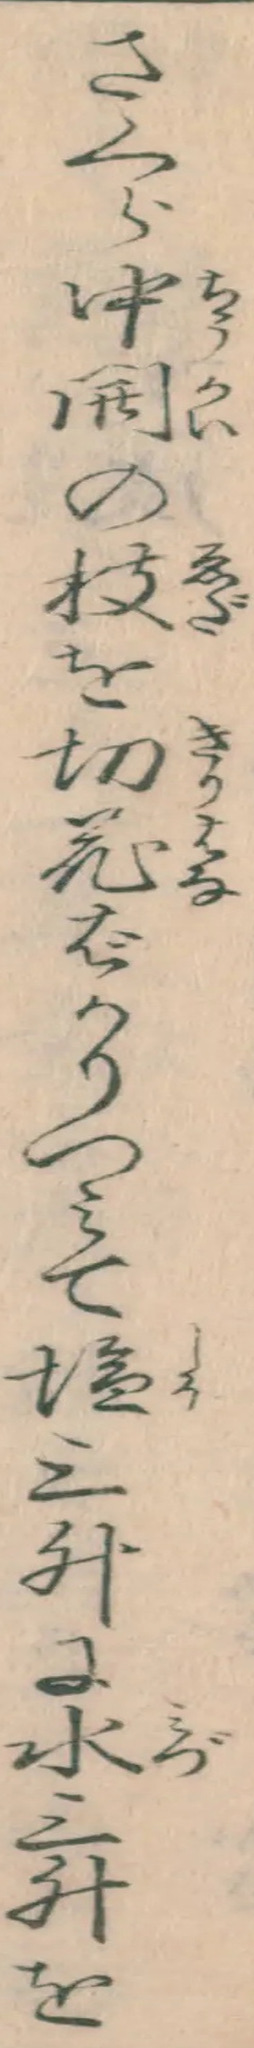さくら中開の枝を切花ばかりつみて塩三升に水三升を
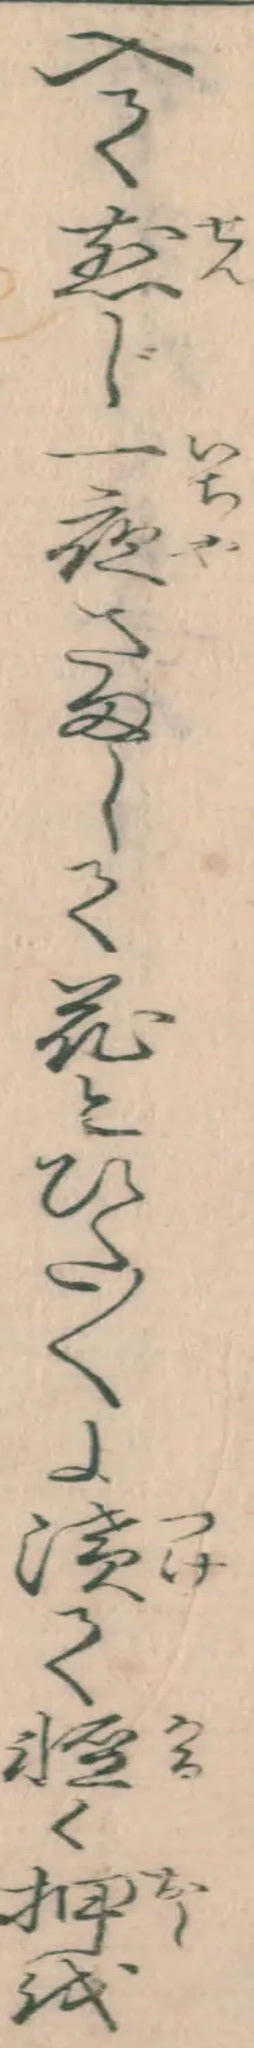入て煎じ一夜さまして花とひた〳〵に漬て軽く押を
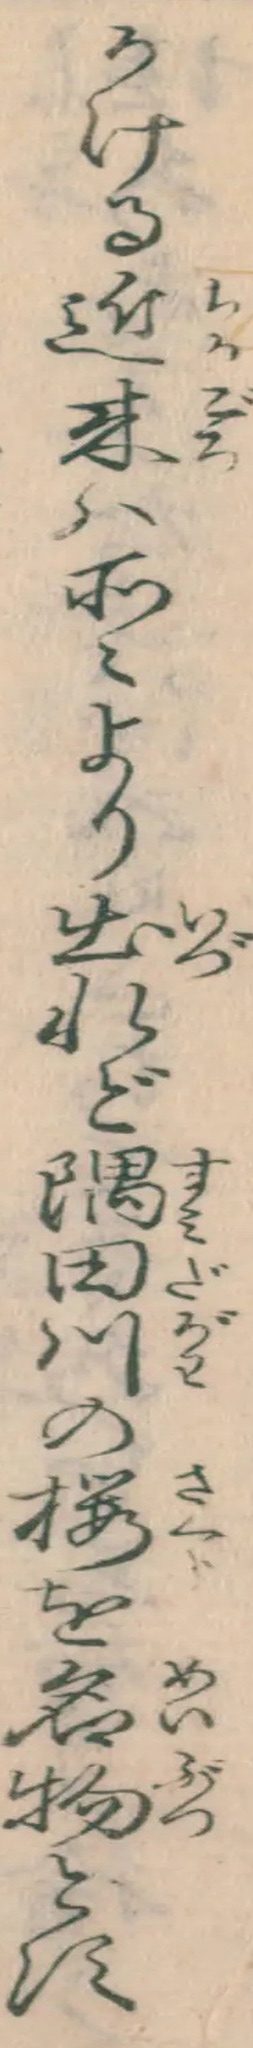かける近来は所々より出れど隅田川の桜を名物とす
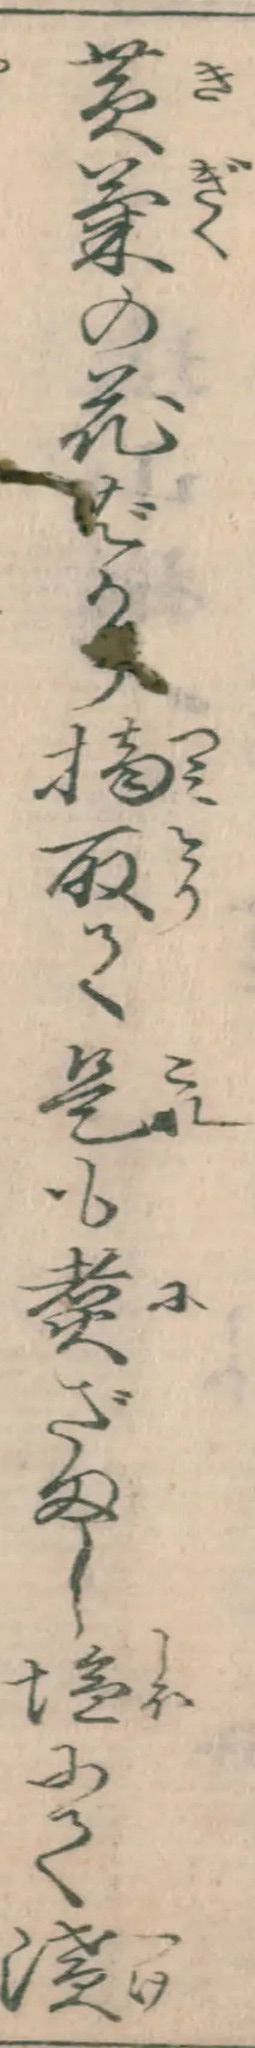黄菊の花ばかり摘取て是も煮ざまし塩にて漬
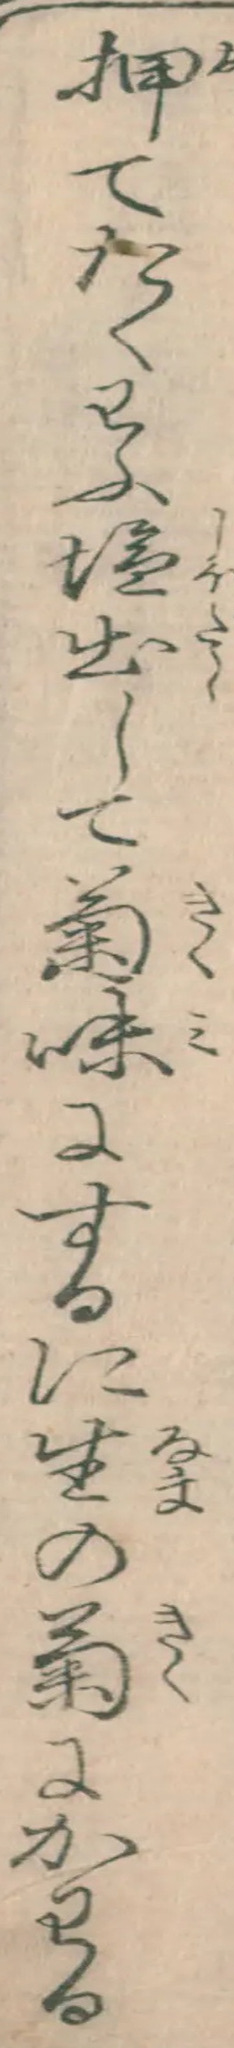押てたくわふ塩出して菊味にするに生の菊にかわる

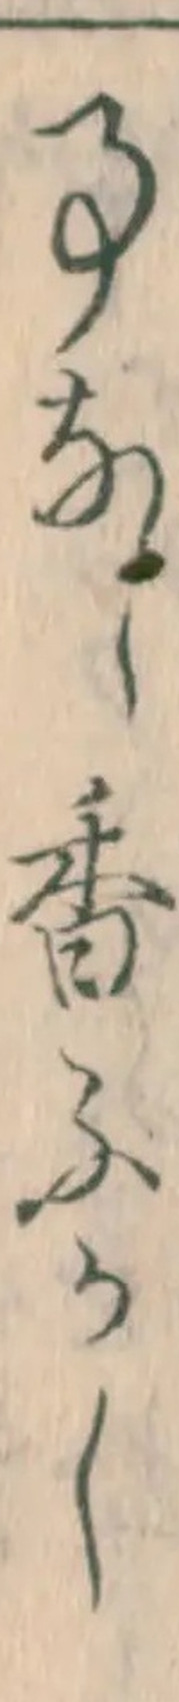事なし香ふかし
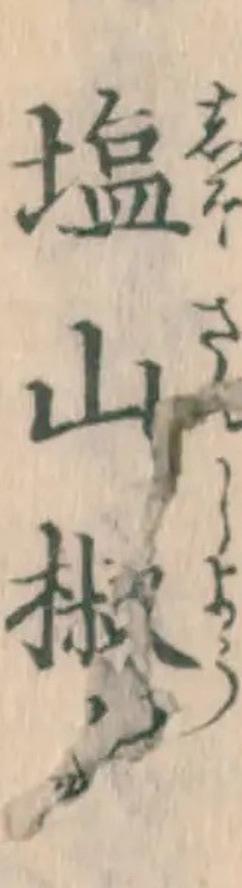塩山椒
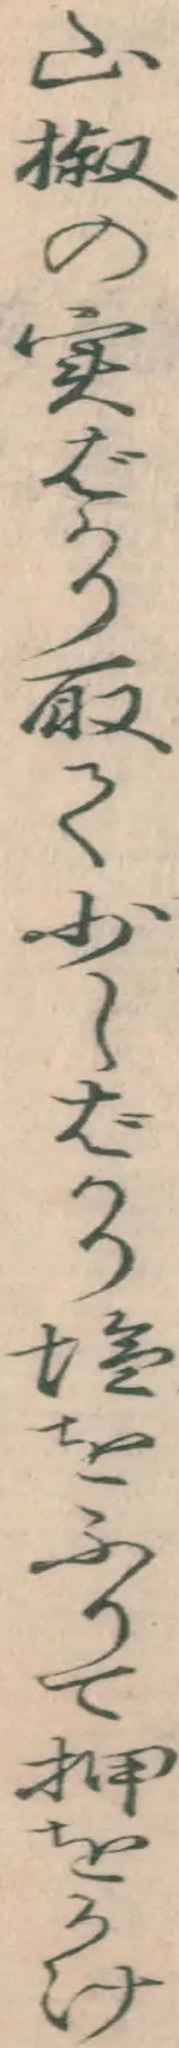山椒の実ばかり取て少しばかり塩をふりて押をかけ
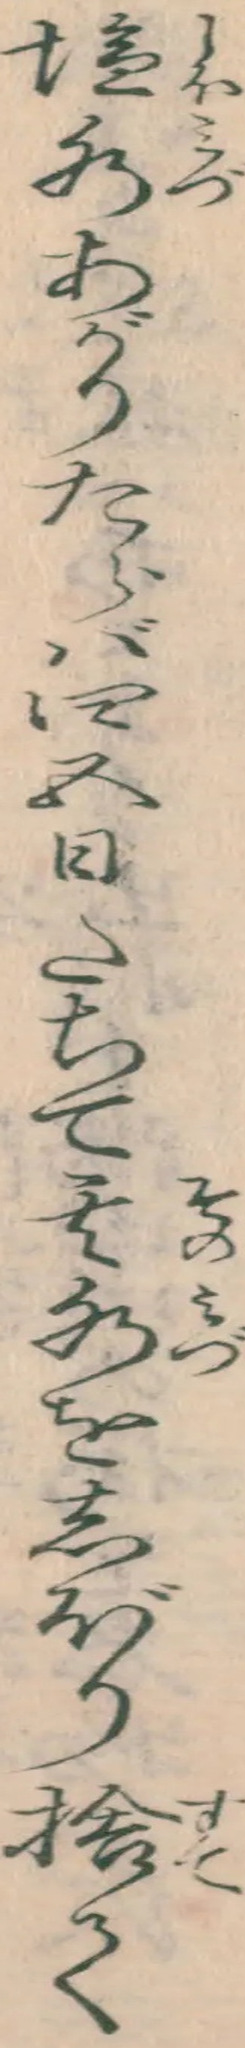塩水あがりたらば四五日たちて其水をしぼり捨て
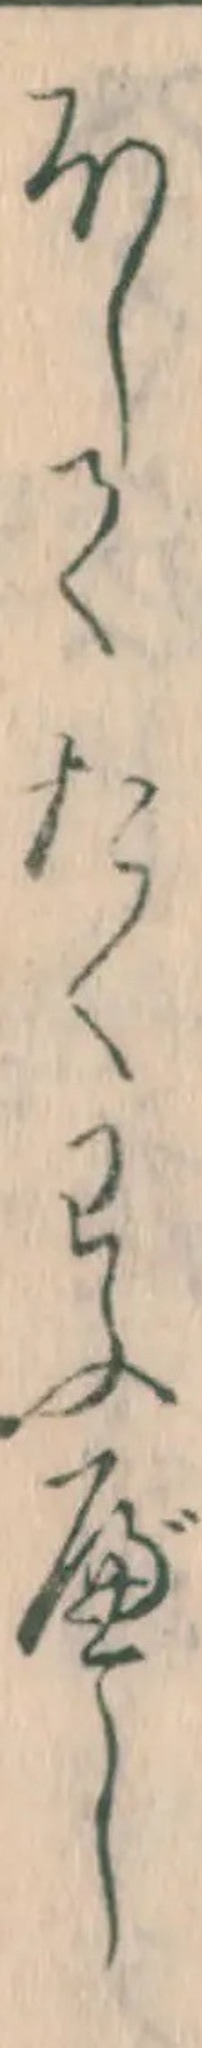ほしてたくわふべし
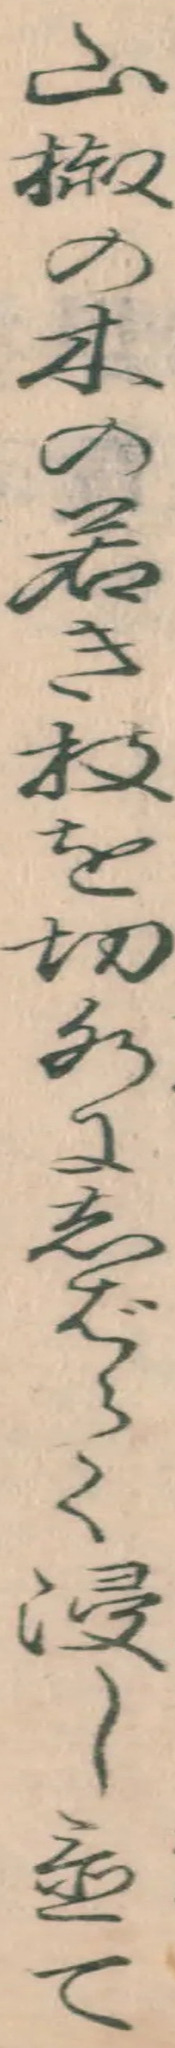山椒の木の若き枝を切水にしばらく浸し置て
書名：四季漬物鹽嘉言
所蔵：国立国会図書館 National Diet Library, JAPAN
